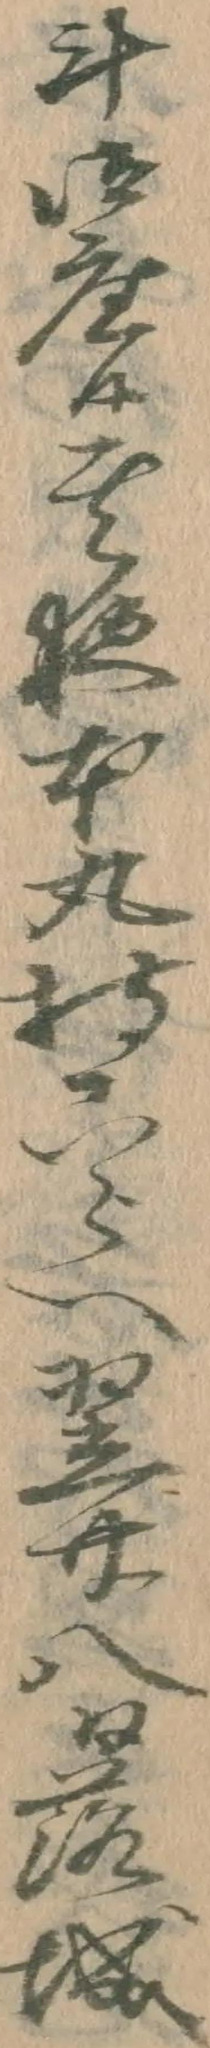斗御座候其夜本丸持古らへ翌廿八日落城
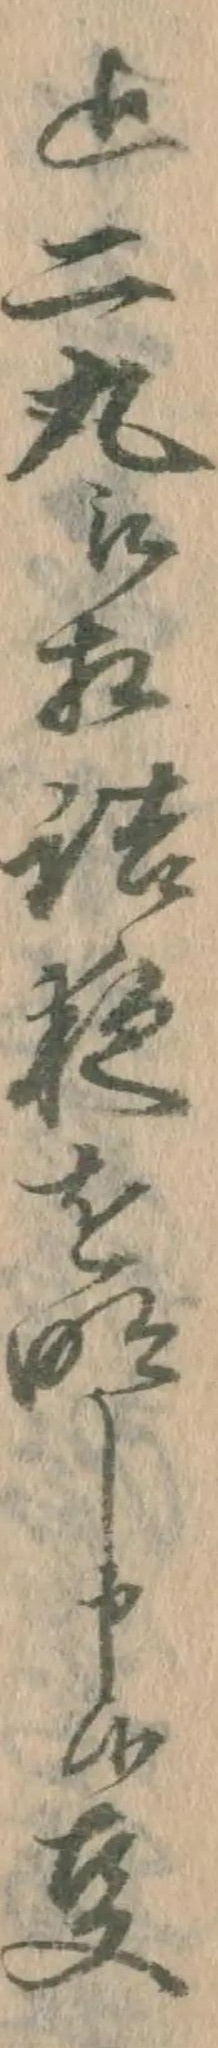迄二丸江相詰夜を明し申候事
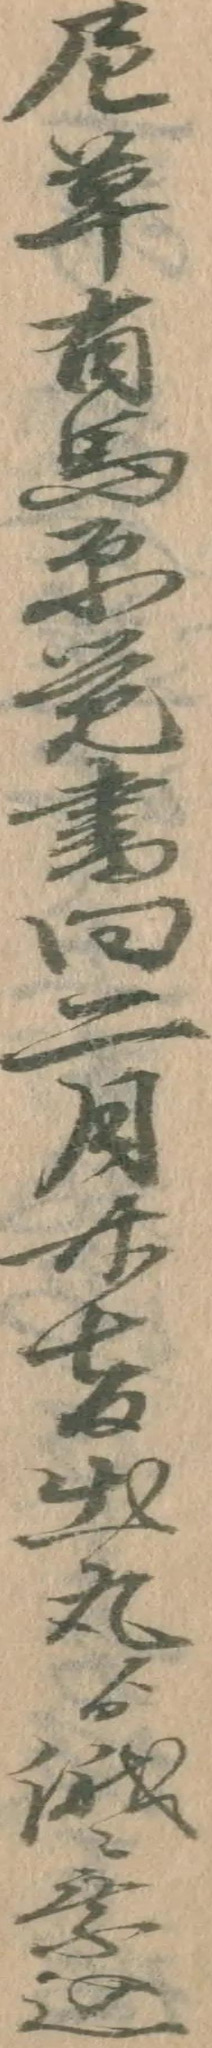尼草有馬原覚書曰二月廿七日出丸ゟ俄に乗込
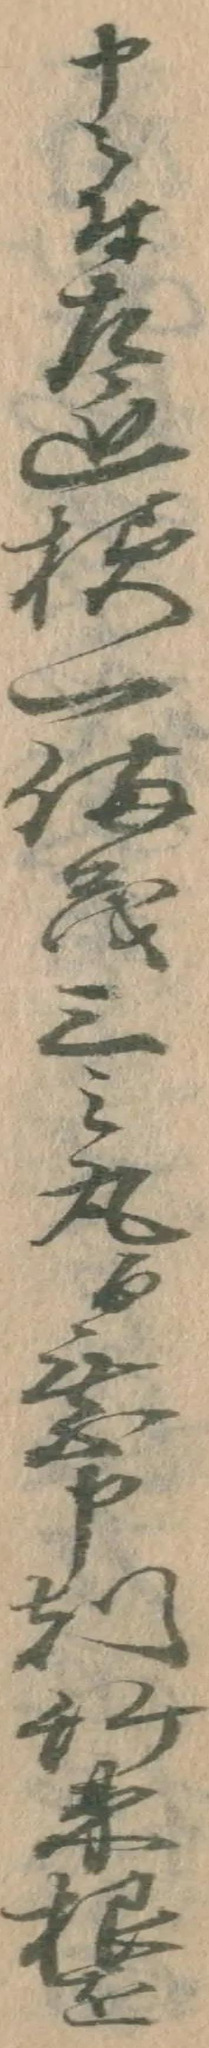申に付左近様一備茂三之丸ゟ乗込申刻竹束根を
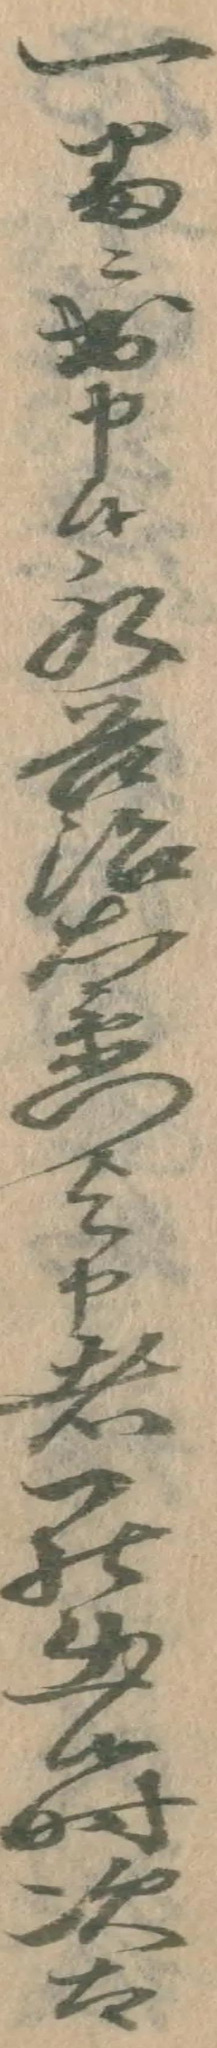一番に出申候水谷治右衛門与申者罷出候時次太
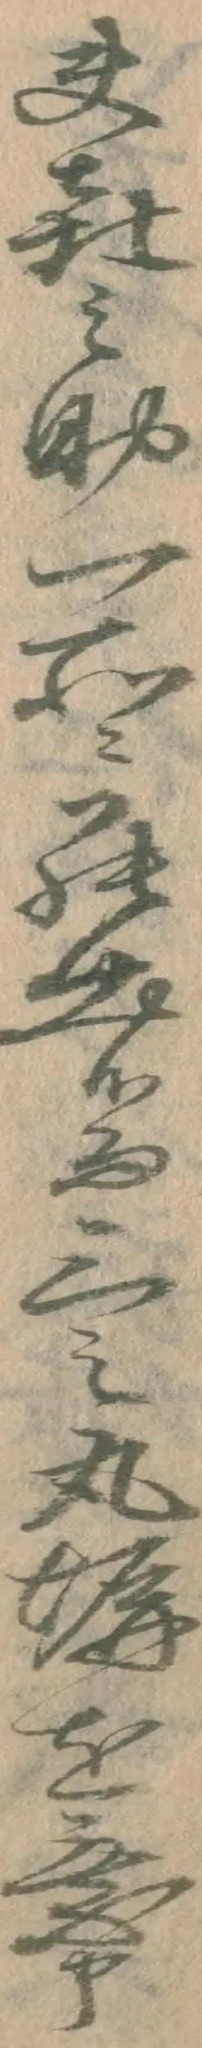夫喜之助一所に罷出候而三之丸塀を乗申
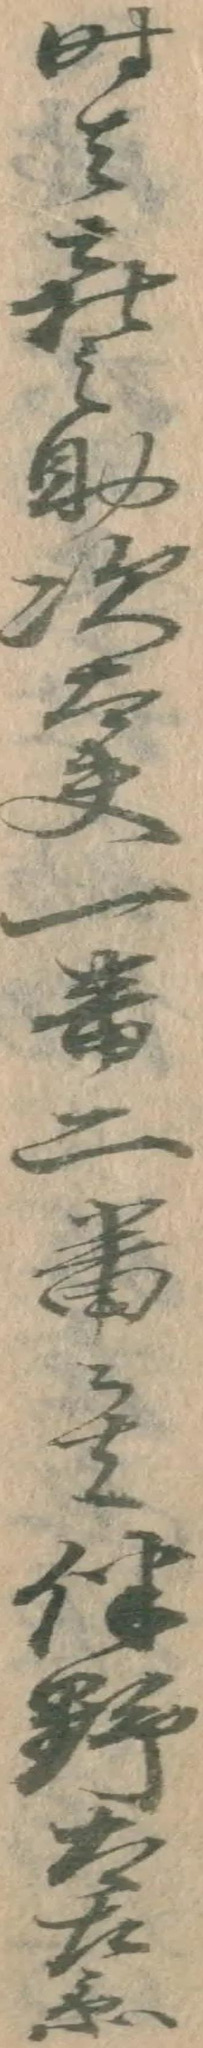時者喜之助次太夫一番二番に者伴野太左衛
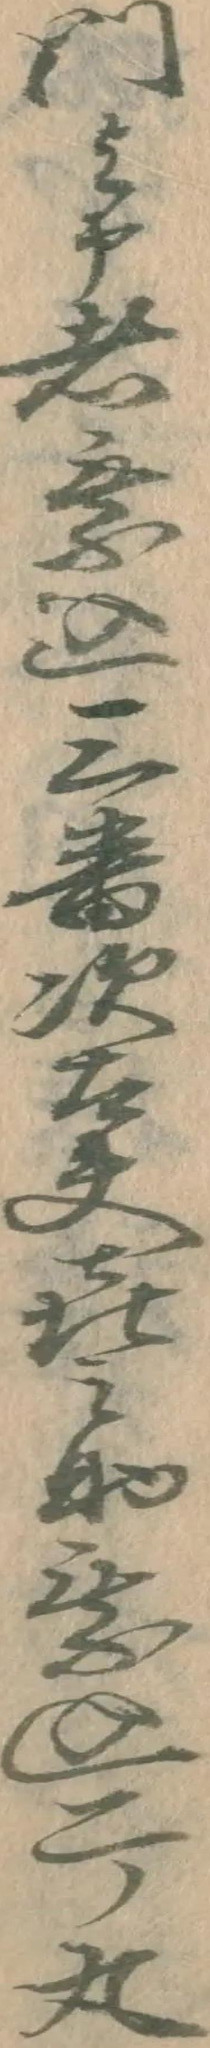門与申者乗込三番次太夫喜之助乗込二之丸
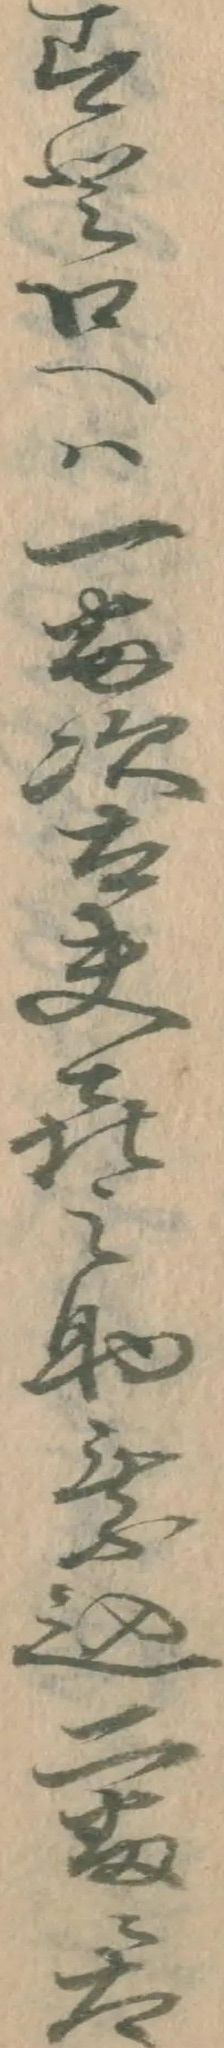春登口へは一番次太夫喜之助乗込二番に太

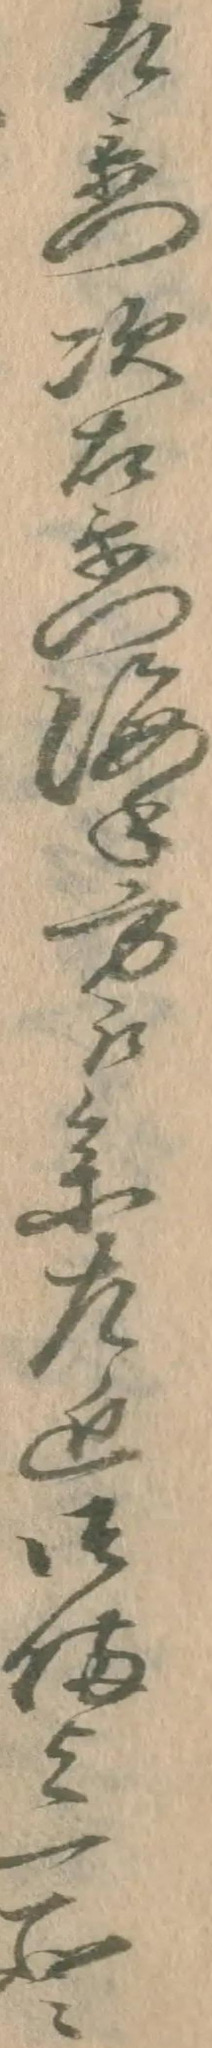左衛門次左衛門海手方江参左近御備与一所に
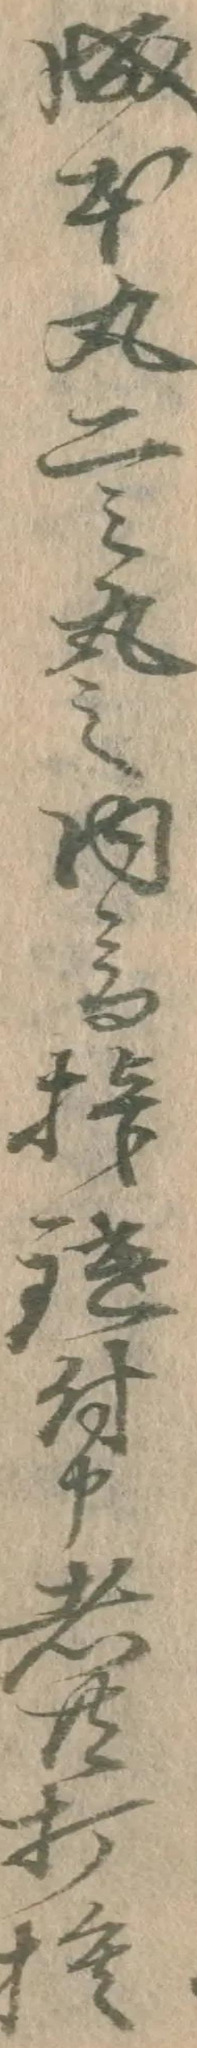成本丸二之丸之内に而挊鑓付申者共打捨
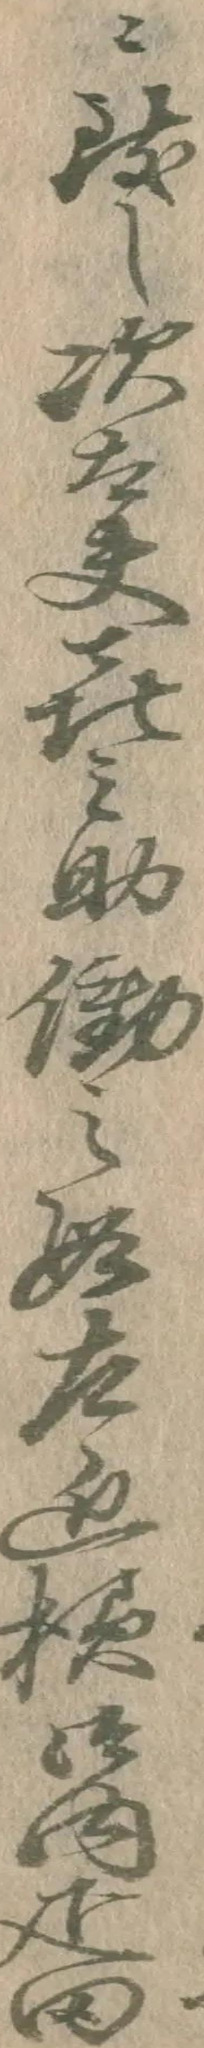に致し次太夫喜之助働之如左近様御内疋田
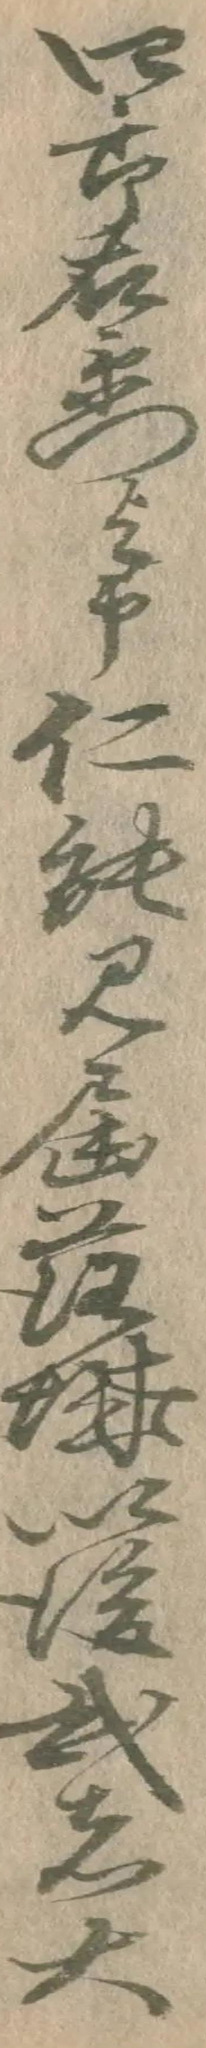四郎左衛門与申仁能見届落城以後武者大
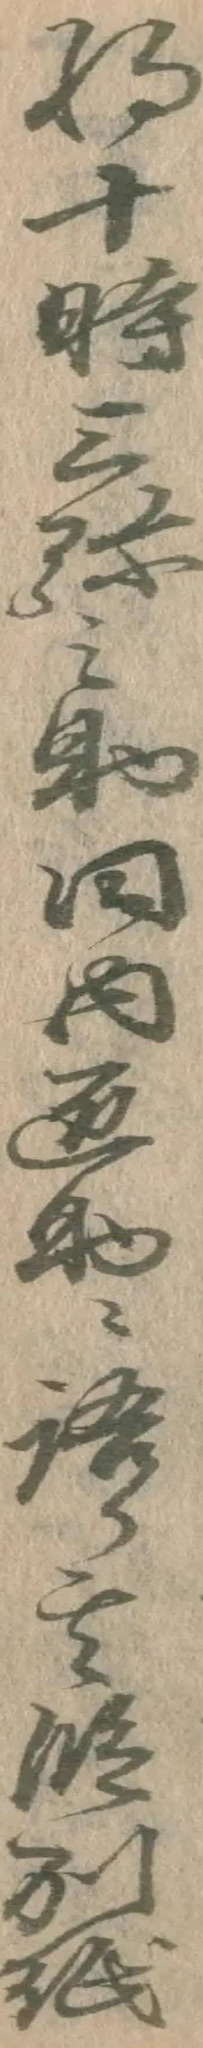将十時三弥之助同内匠助に語り其段別紙
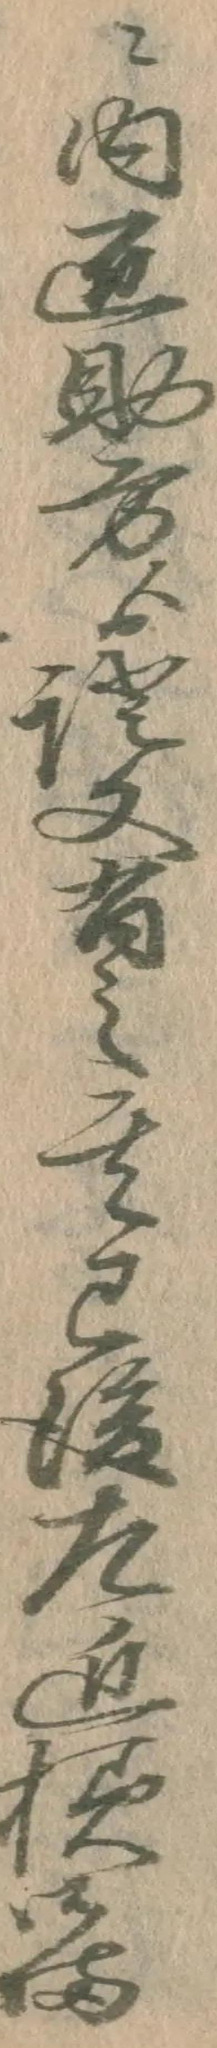に内匠助方ゟ證文有之其己後左近様御備
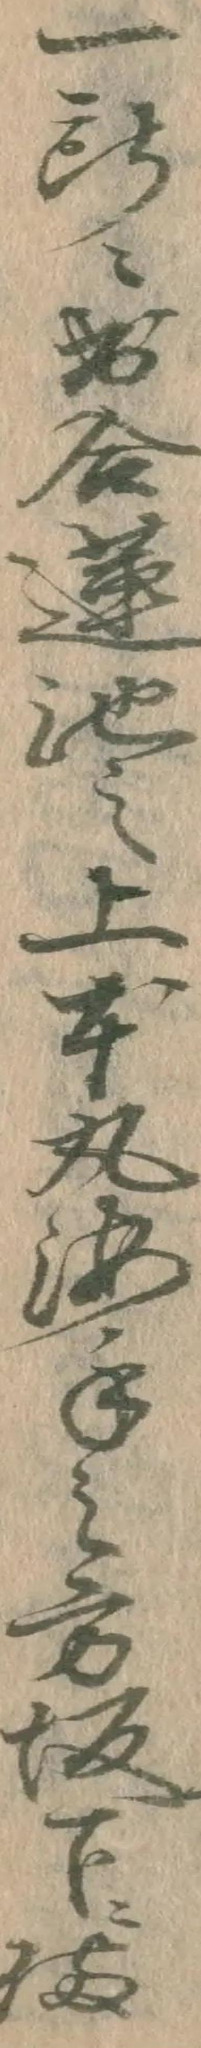一所に出合蓮池之上本丸海手之方坂下に備
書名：切支丹御退治記 49巻. [8]
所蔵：国立国会図書館 National Diet Library, JAPAN
